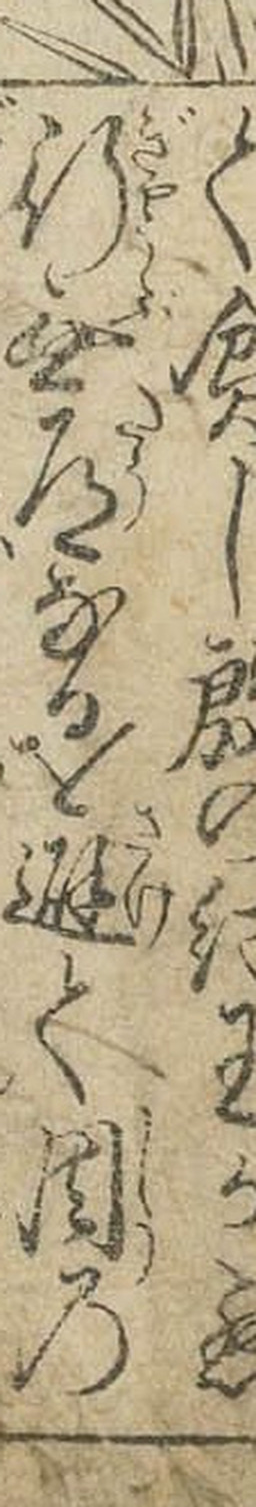行無道なるを避て周の
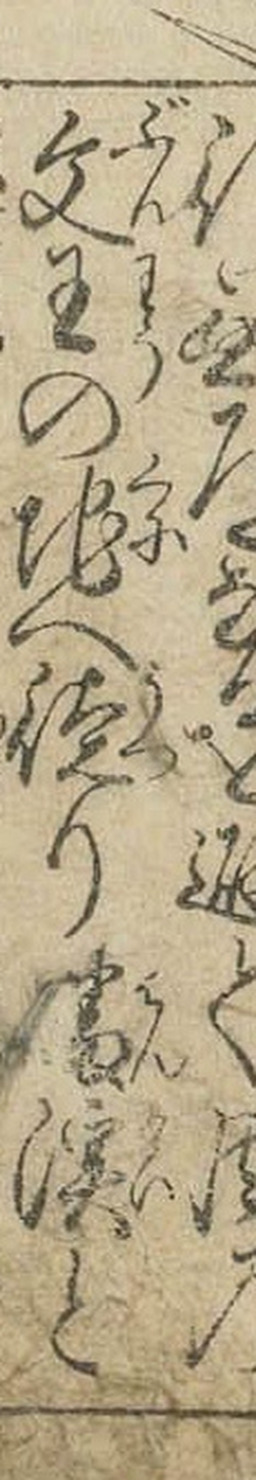文王の地へ徒り磻溪と
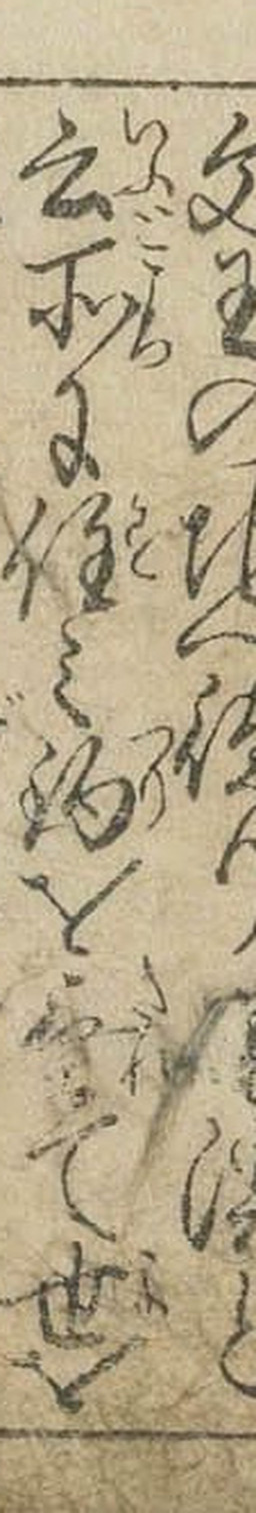云所に住み釣を垂て世を
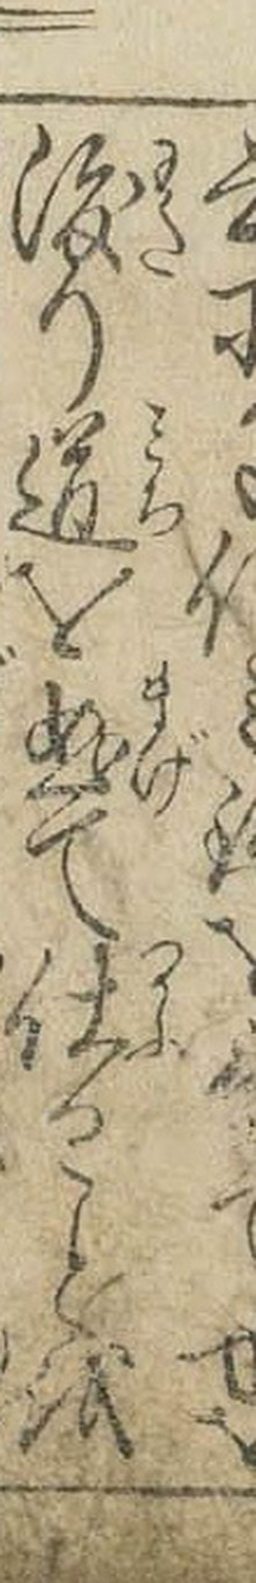渡り道を曲て仕ることを
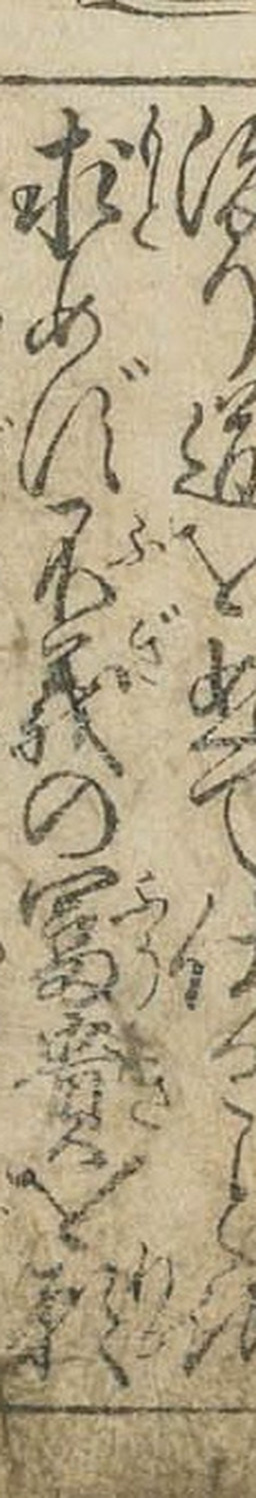求めず不義の富貴を願
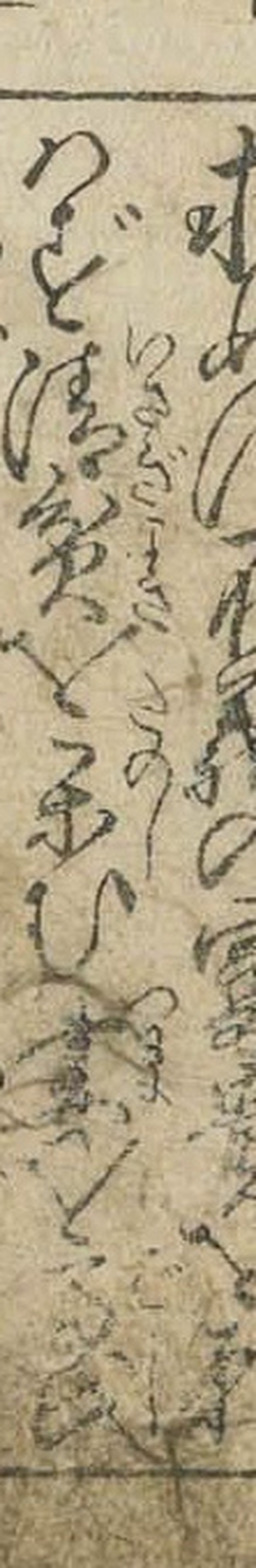はず清貧を楽む妻を馬氏
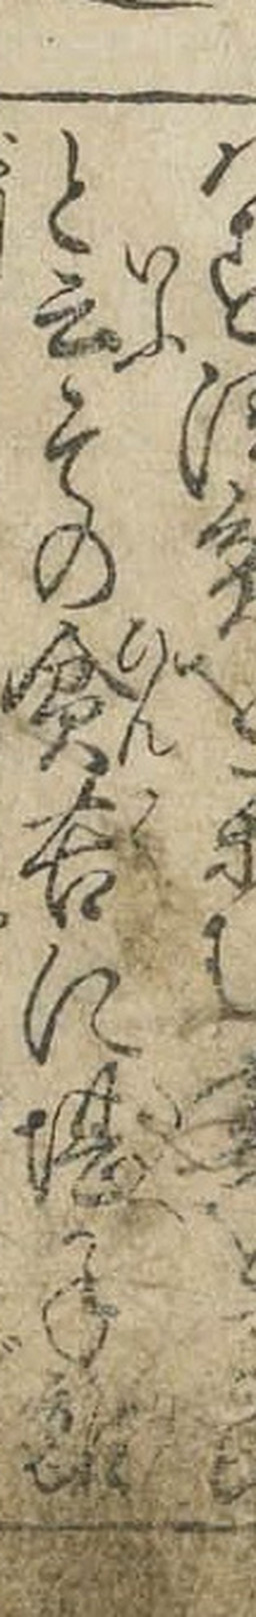と云その貧苦に堪かね離
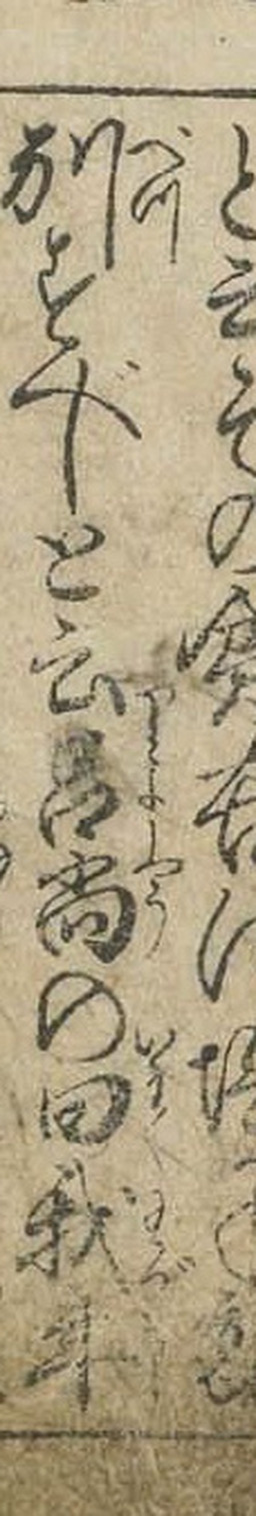別すべしと云呂尚の曰我年
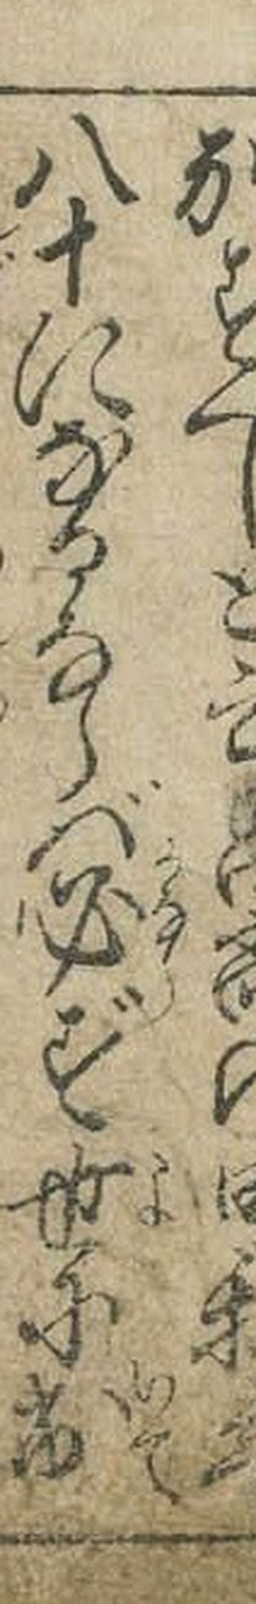八十になるならば必ず世に出
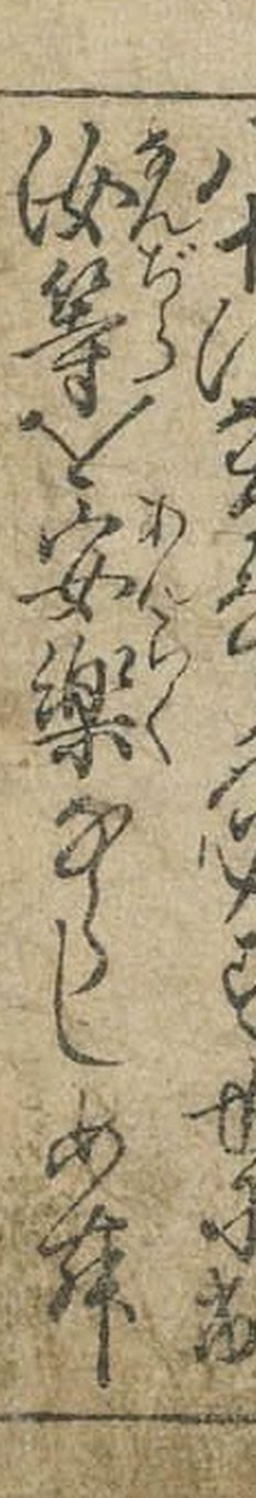汝等を安楽ならしめむ

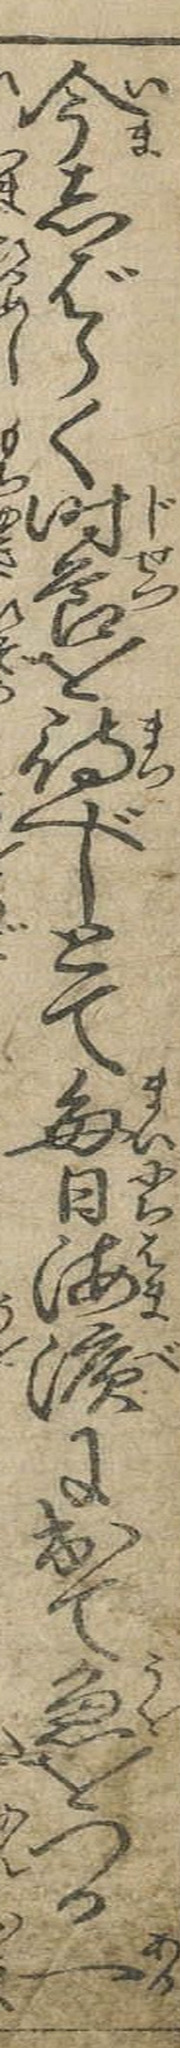今しばらく時節を待べしとて毎日海浜に出て魚をつる一
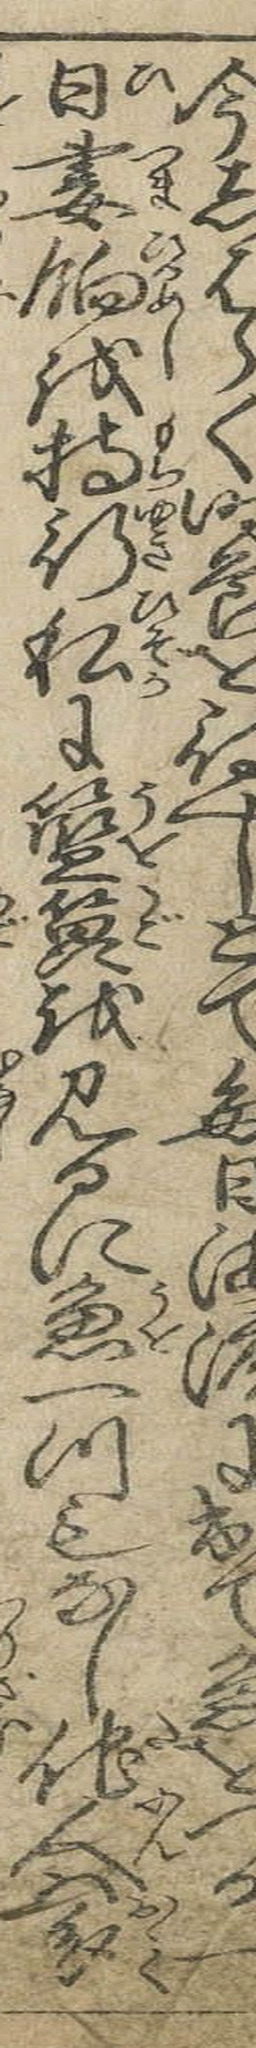日妻餉を持行私に籃䉪を見るに魚一つもなし他人は多
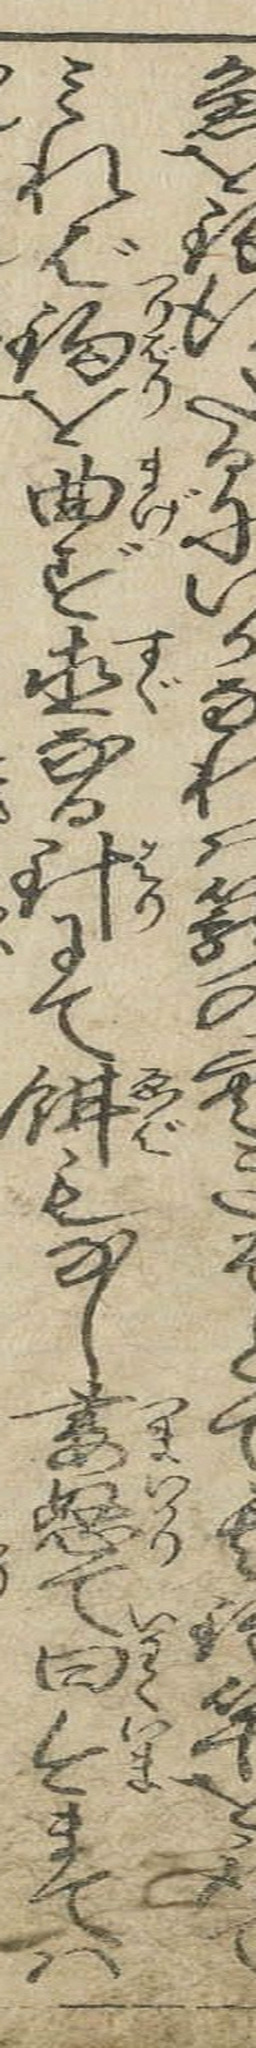みれば鉤を曲ず直なる針にて餌もなし妻怒て曰今まては
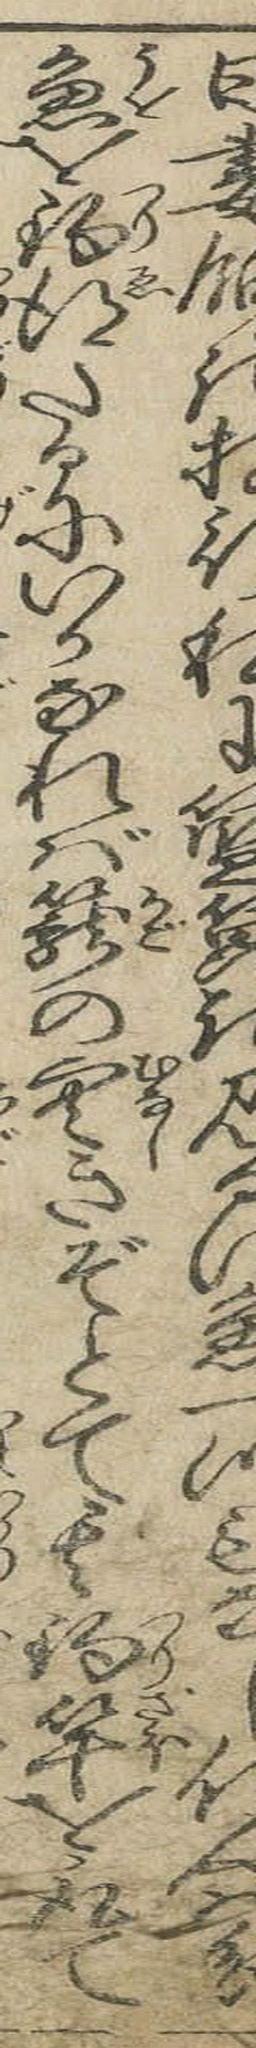魚を釣得たるにいかなれば籠の空きぞとて其釣竿を取て
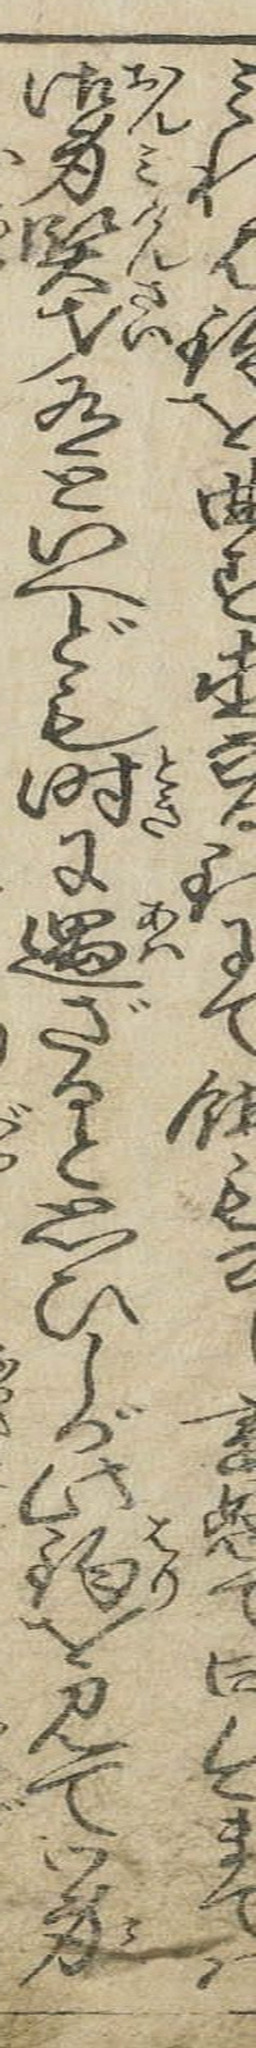御身賢才有といへども時に遇ざると思ひしが此鉤を見て御身
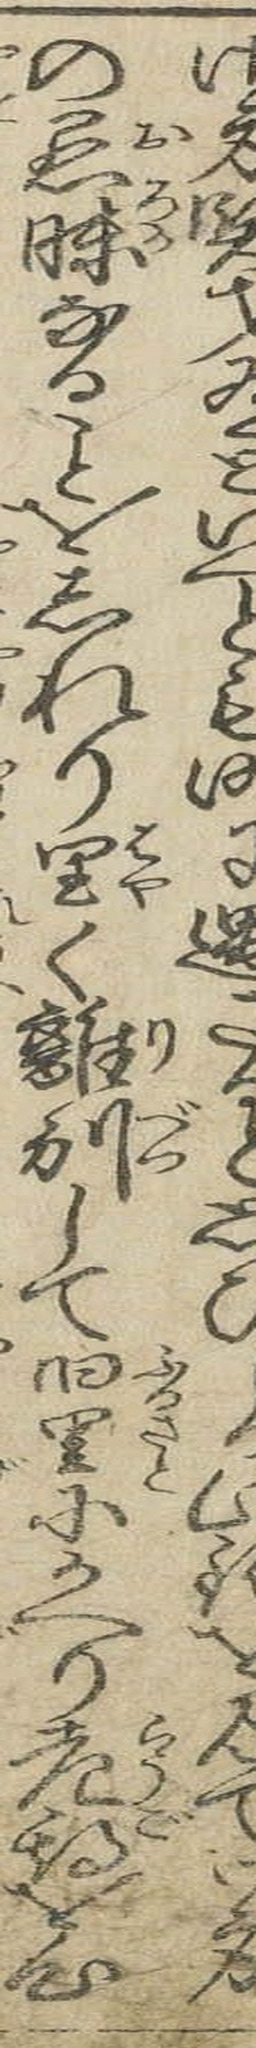の愚昧なることをしれり早く離別して旧里にかへり老期を心
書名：絵本写宝袋 9巻 4之巻
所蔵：東京学芸大学教育コンテンツアーカイブ
